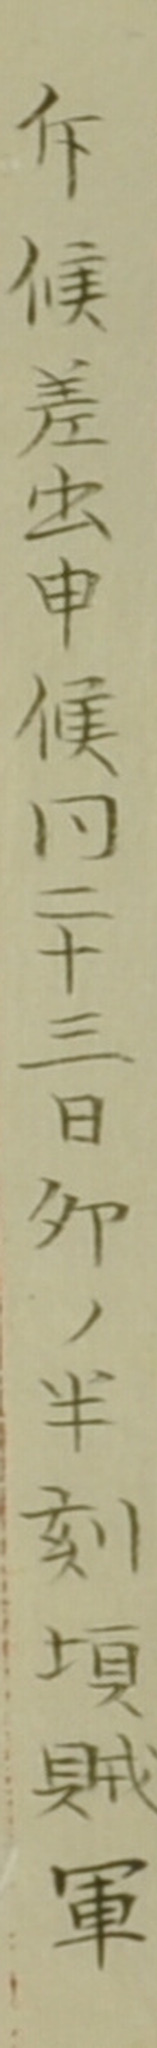斥候差出申候同二十三日卯ノ半刻頃賊軍
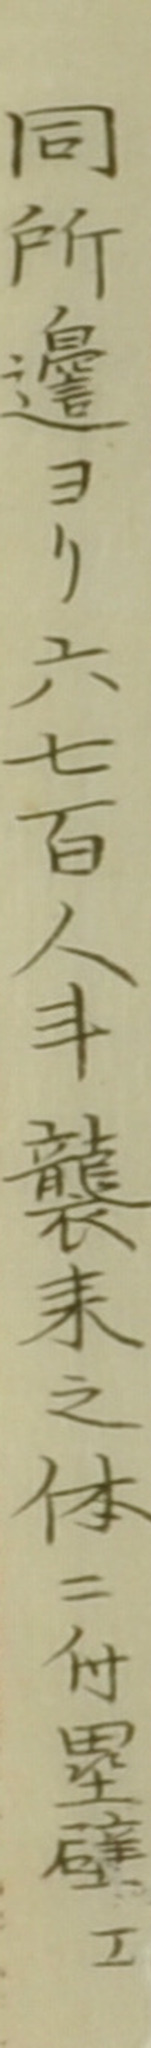同所辺ヨリ六七百人来襲之体ニ付塁壁エ

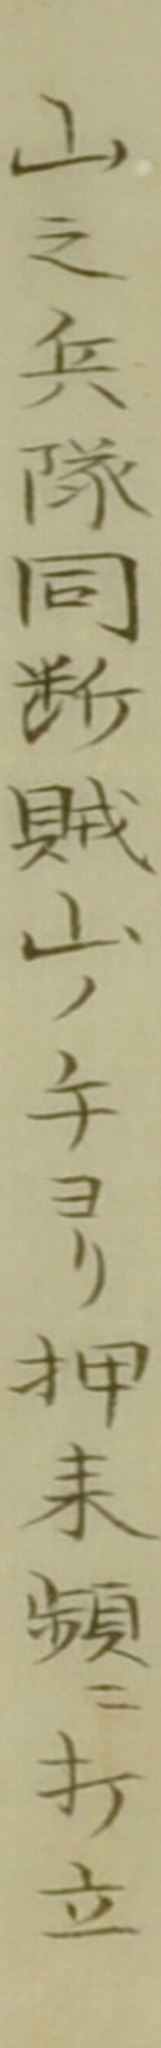山之兵隊同断賊山ノ手ヨリ押来頻ニ打立
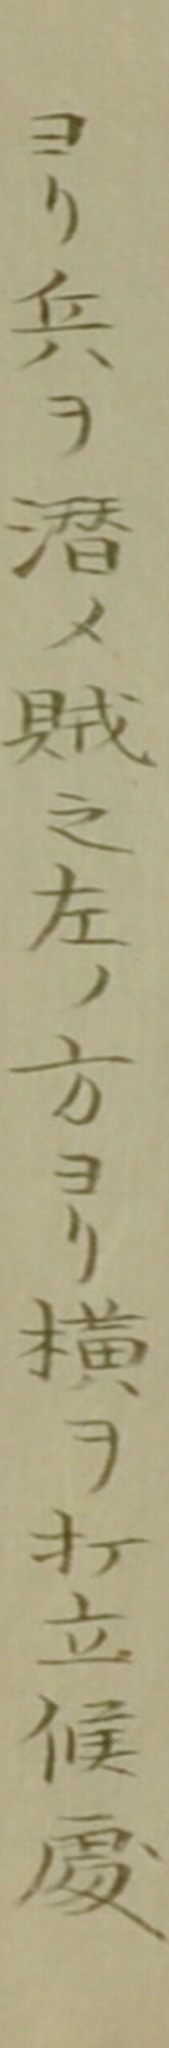ヨリ兵ヲ潜メ賊之左ノ方ヨリ横ヲ打立候処
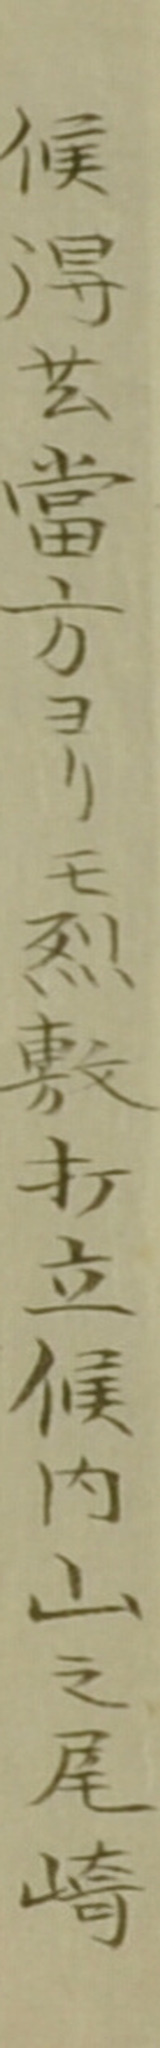候得共当方ヨリモ烈敷打立候内山之尾崎
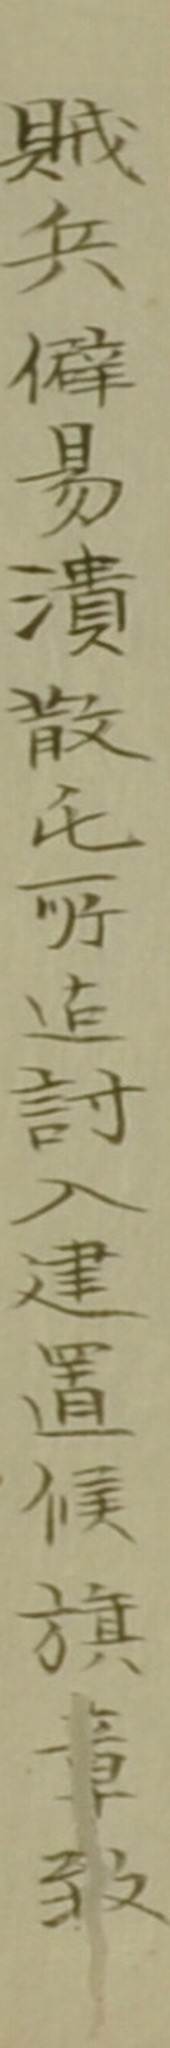賊兵僻易潰散屯所迄討入建置候旗章致
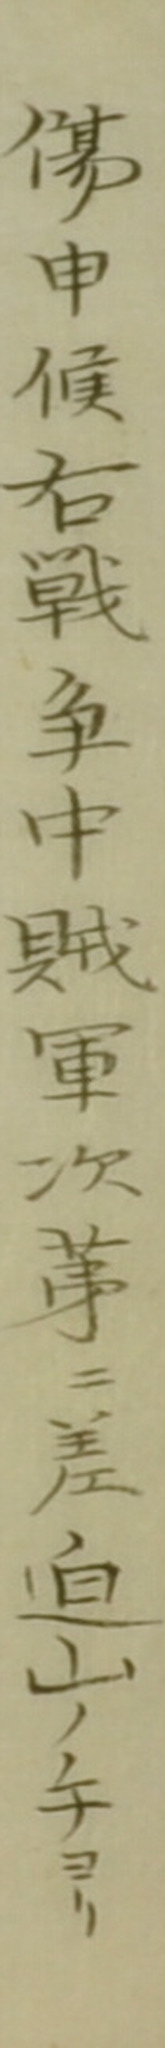傷申候右戦争中賊軍次第ニ差迫山ノ手ヨリ
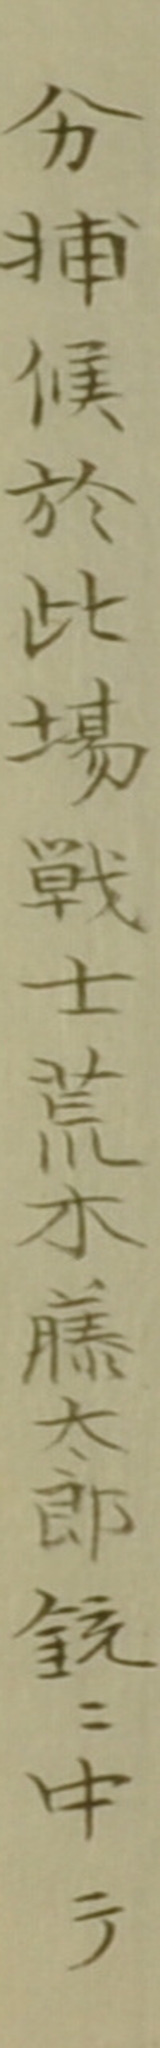分捕候於此場戦士荒木藤太郎銃ニ中テ
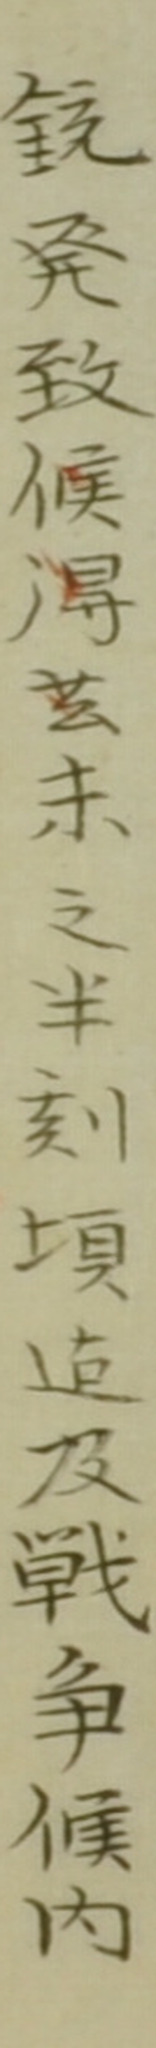銃発致候得共未之半刻頃迄及戦争候内
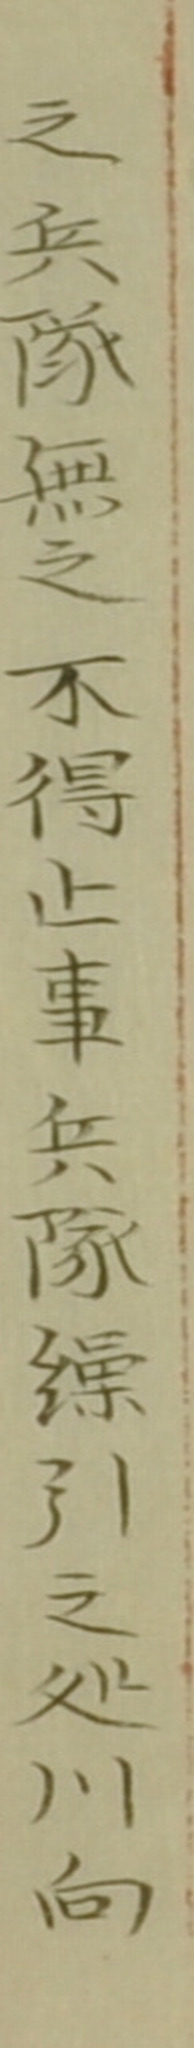之兵隊無之不得止事兵隊繰匹引之処川向
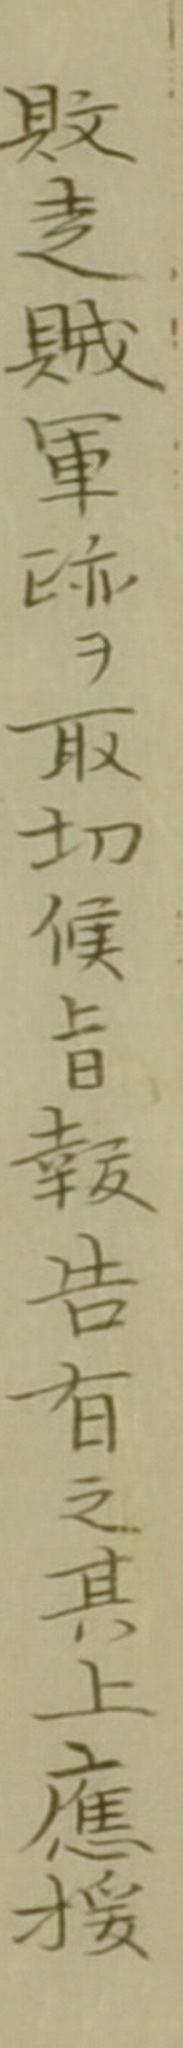敗走賊軍跡ヲ取功候旨報告有之其上応援
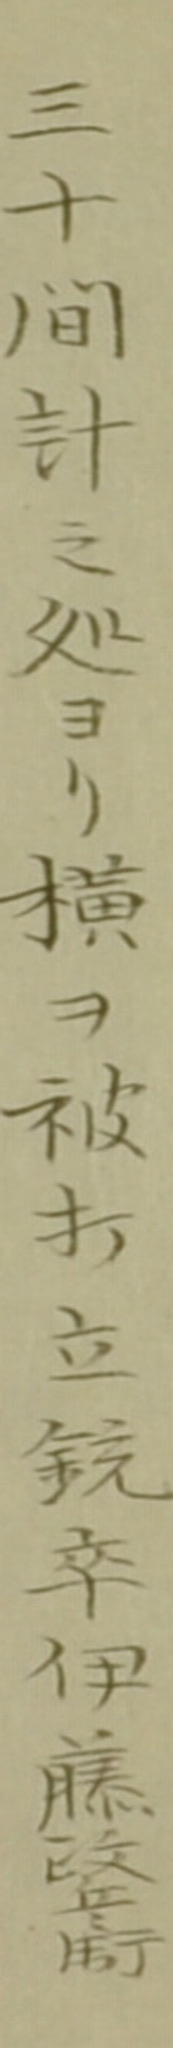三十間計之処ヨリ横ヲ被打立銃卒伊藤政兵衛
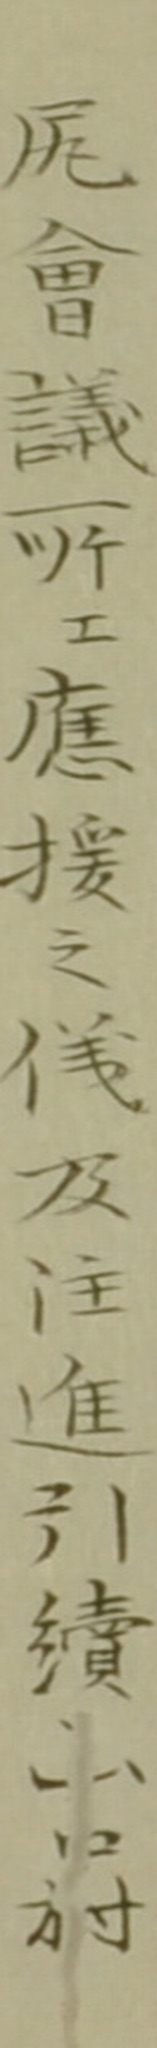尻会議所エ応援之儀及注進引続山口村
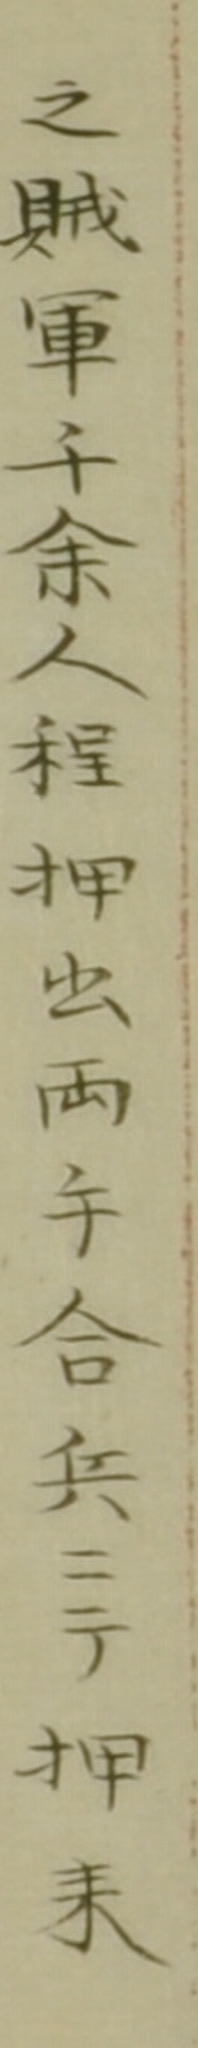之賊軍千余人程押出両手合兵ニテ押来
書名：奥越出兵中戦争之事件概略抄録（控）
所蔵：伊那市立高遠町図書館・合同会社AMANE
